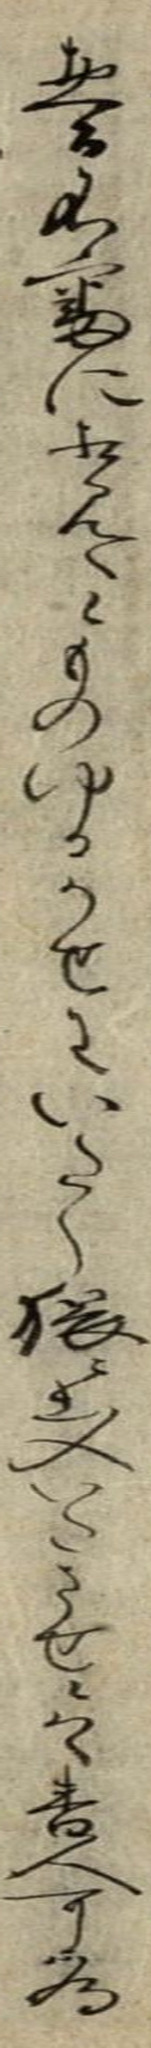一惣て不審に相見へ候ものゆるかせにいたし猥に出入いたさせ候はゝ番人可為
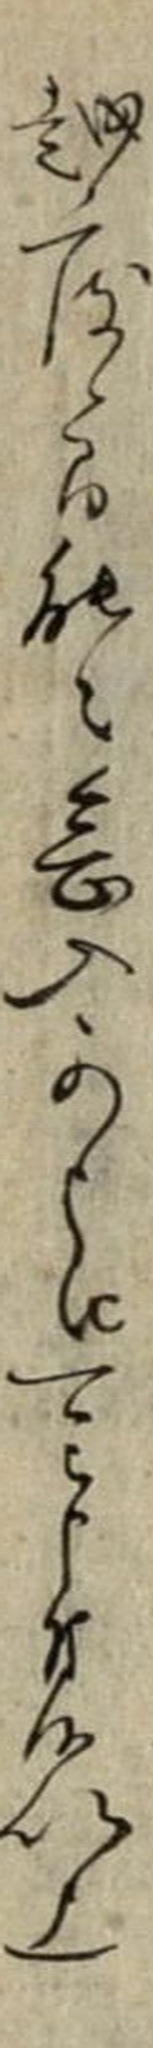越度候間能々念入可申由可被申付候以上
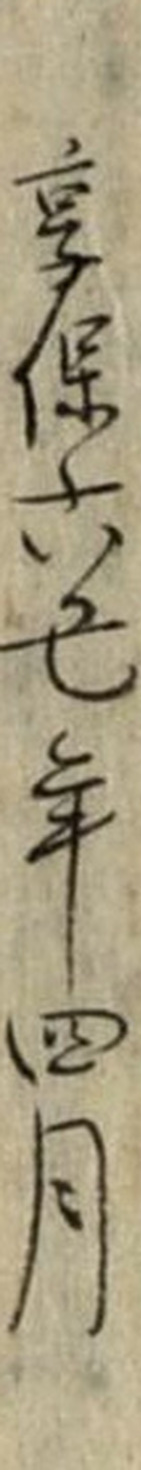享保六丑年四月
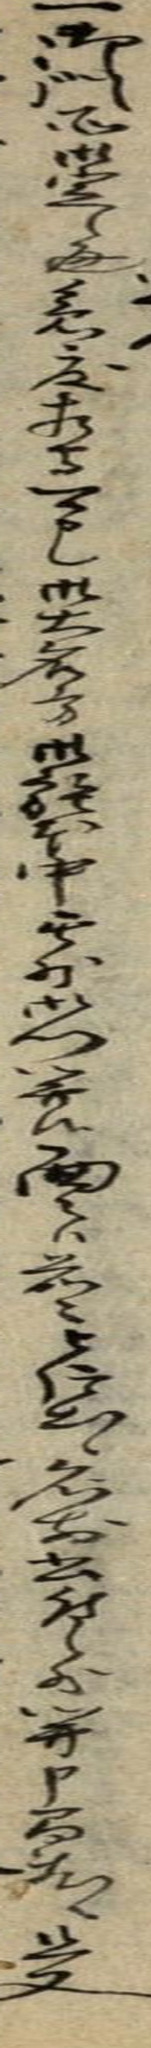一御門所御定之通急度相守可申候御大名方御旗本中其外御門開候面々は前々被仰出候名前書付之外開申間敷候且又
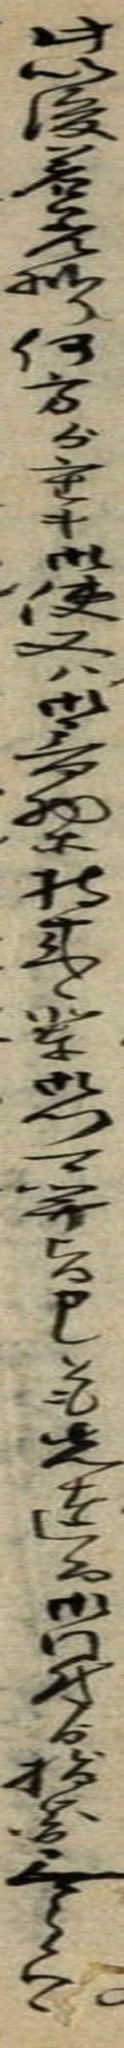此以後着先掛り何方ゟ重き御使又は御音物等持来候輩御門可開旨申候とも先達て御目付ゟ指図無之候はゝ
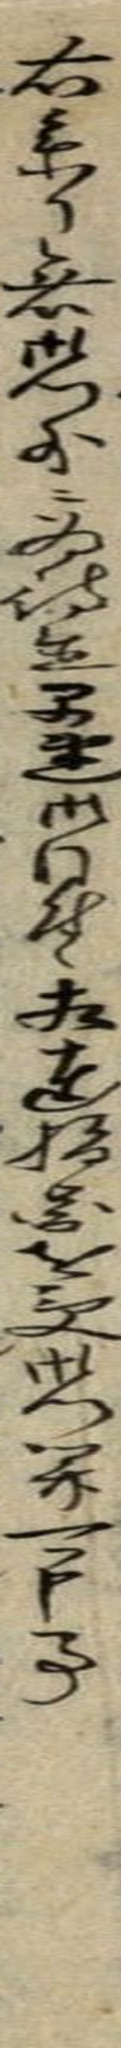右参り候者御門外に為待置早速御目付へ相達指図を受御門開可申事
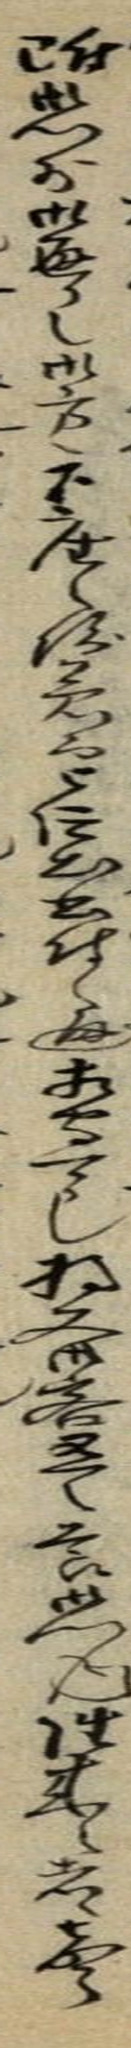附御門外御通り之御方へ下座之儀兼て被仰出書付之通相守可申候将又御客有之節御門内往来之者へ声
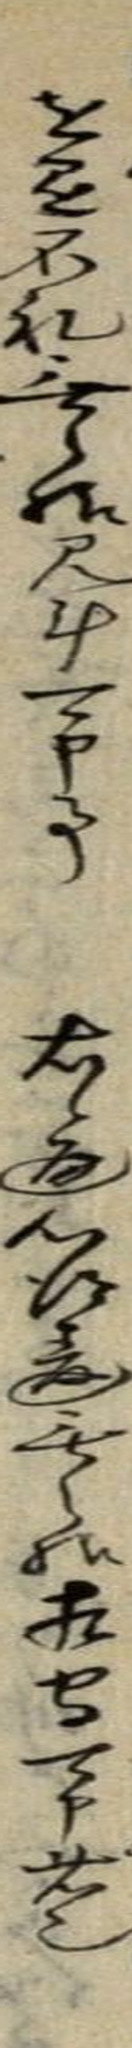を遣不礼無之様見計可申事右之通心得違無之様相守可申者也
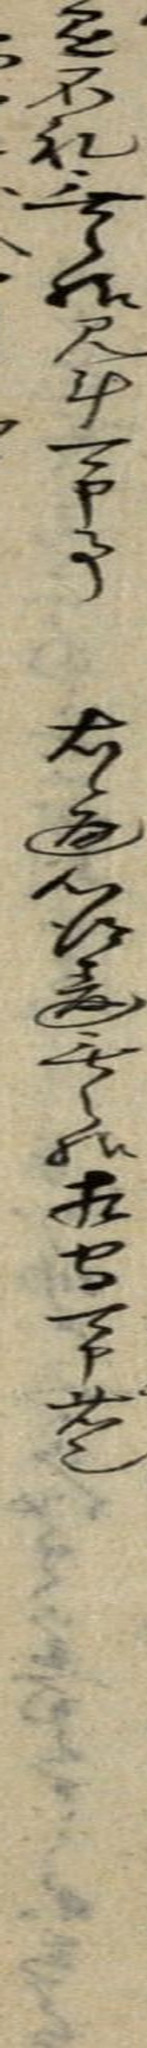を遣不礼無之様見計可申事右之通心得違無之様相守可申者也
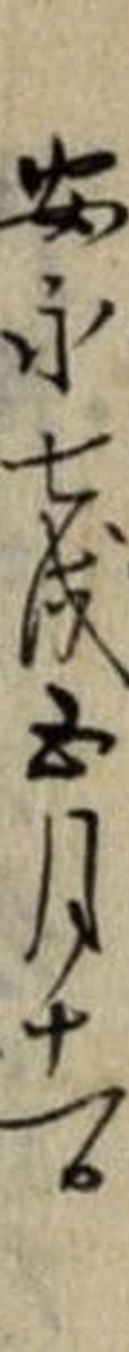安永七戌五月十一日
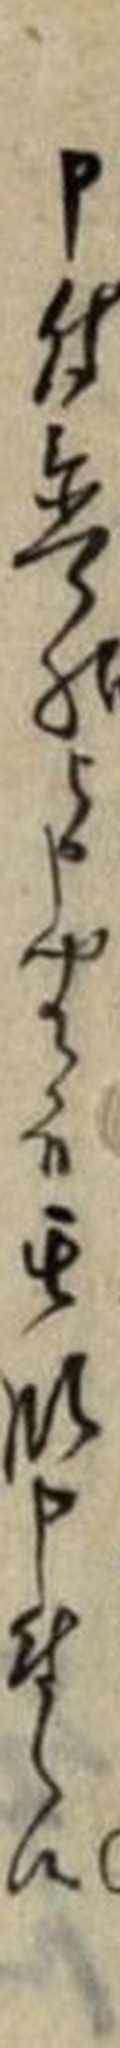申付置候様被申聞候付其段申付候
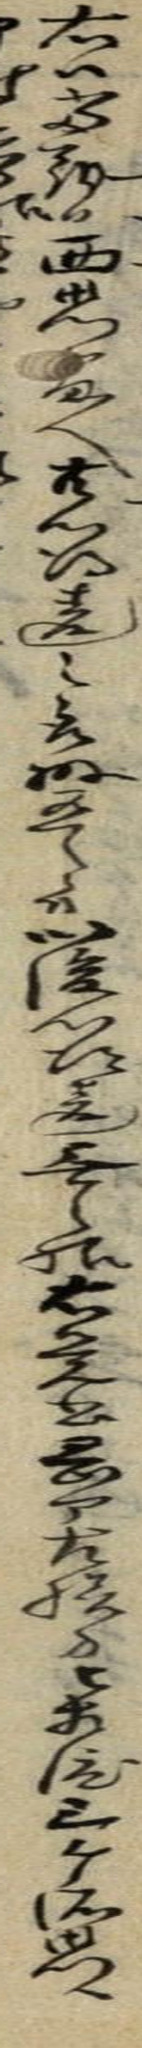右は当朔日西御門番人共心得違之取扱有之に付以後心得違無之様右覚書岡部左膳方被相渡三ケ所御門へ
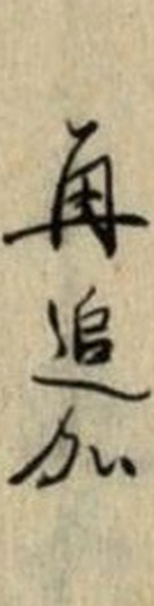再追加
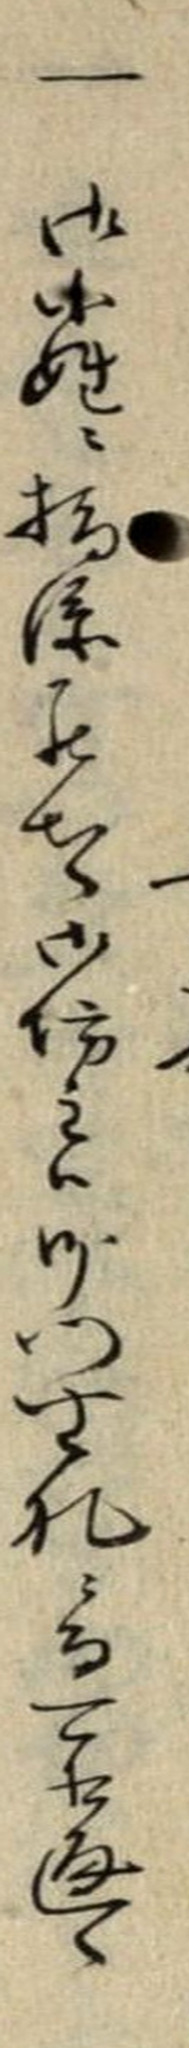一御小姓に指添罷出候御坊主は御門無札にて可相通候
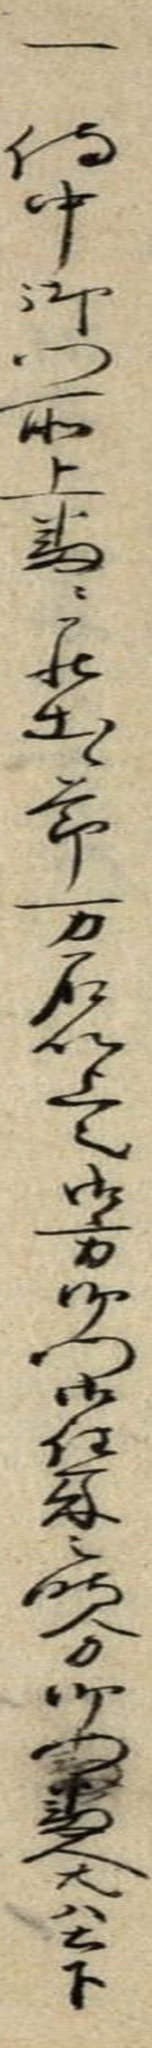一侍中御門所上番に罷出候節万石以上之御方御門御往来之時分御門番人共は土下
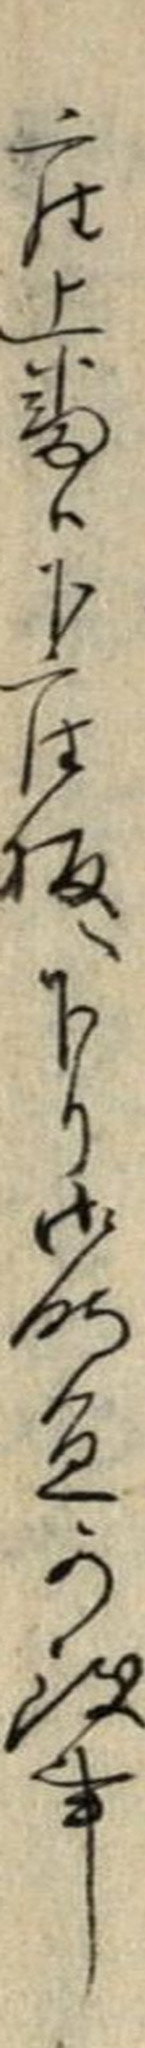座上番は下座板へ下り御時宜可致事
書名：三都并道中之部
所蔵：福井県文書館 Fukui Prefectural Archives
